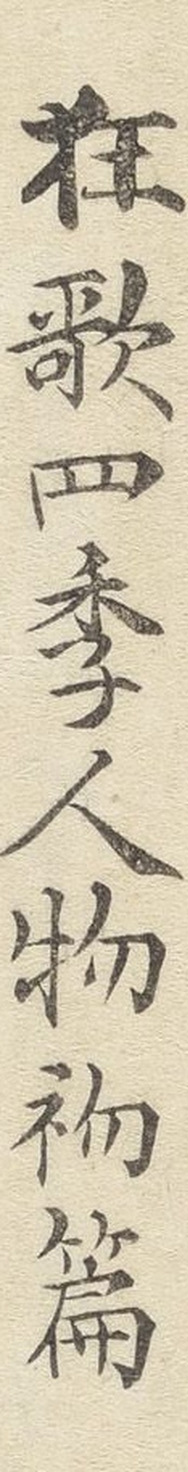狂歌四季人物諸初篇
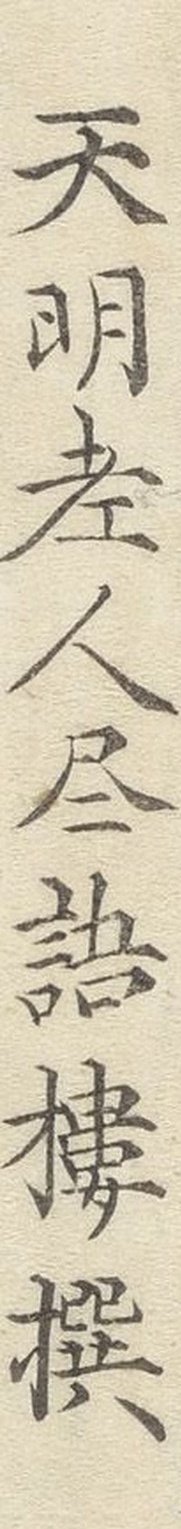天明老人尽語楼撰
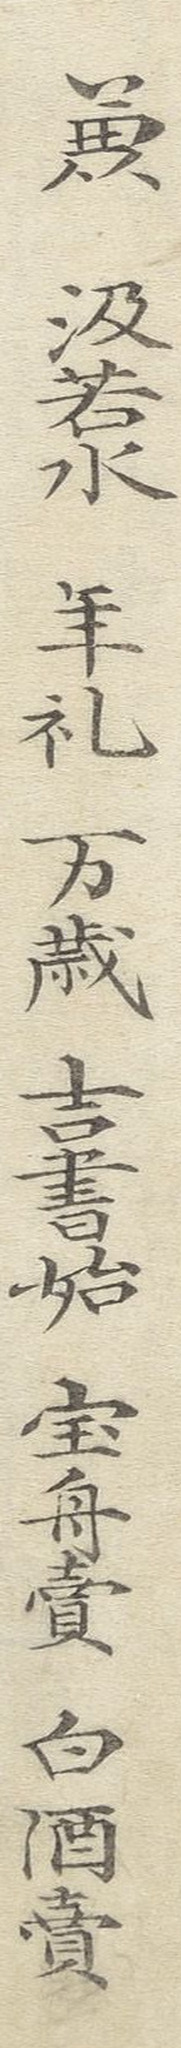兼汲若水年礼万歳吉書始宝舟売白酒売
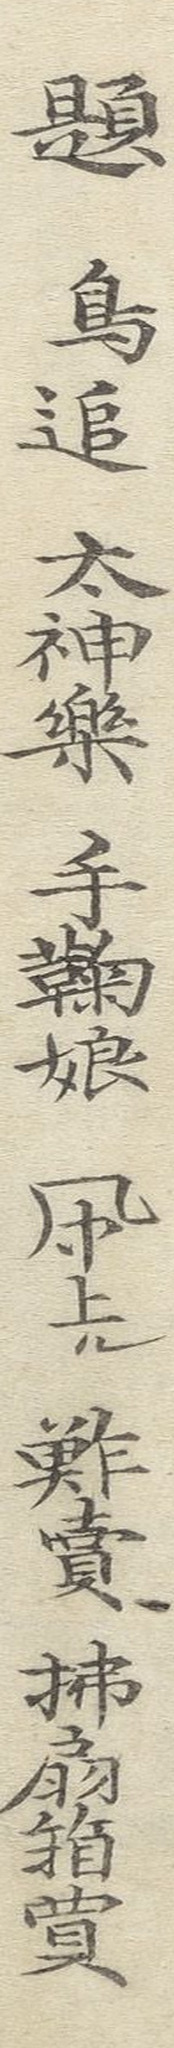題鳥追太神楽手鞠娘凧上ル鮓売払扇箱買

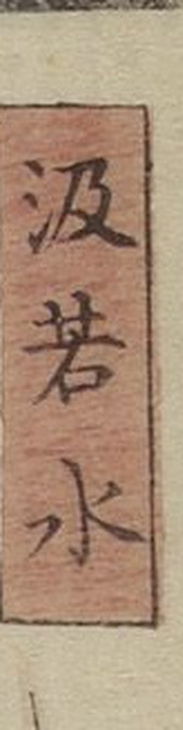汲若水
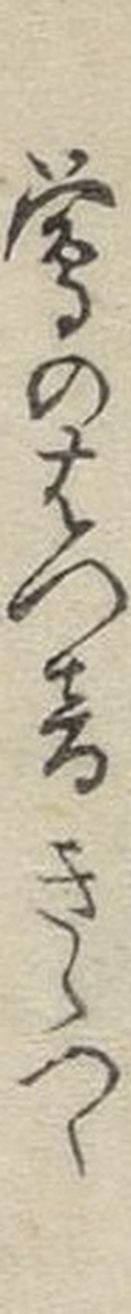鶯のはつ音きゝつゝ
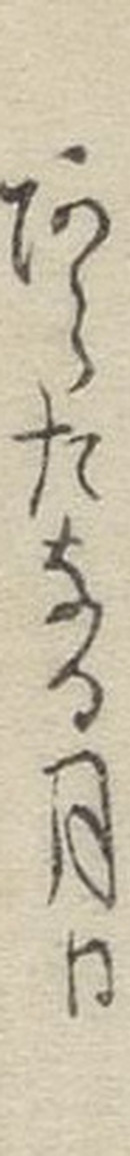あらたなる月日
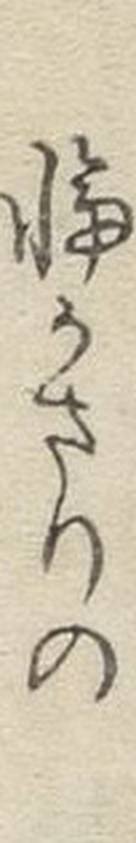わかさりの
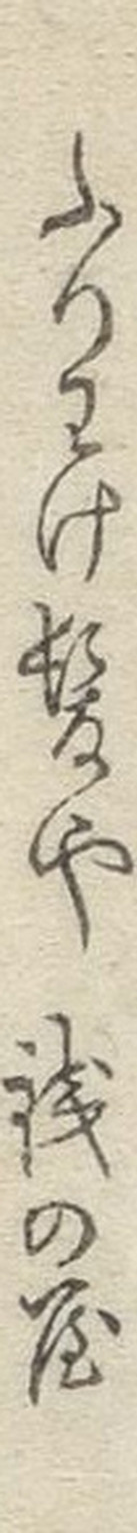ふりわけ髪や銭の屋
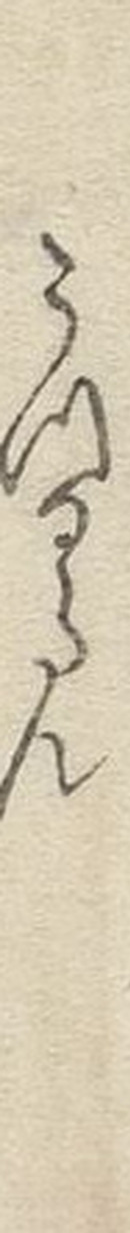うつるらん
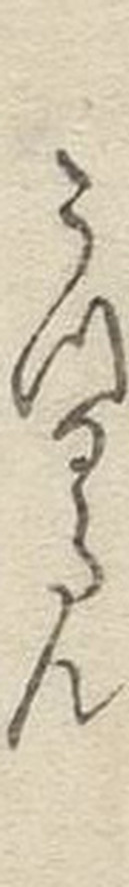うつるらん
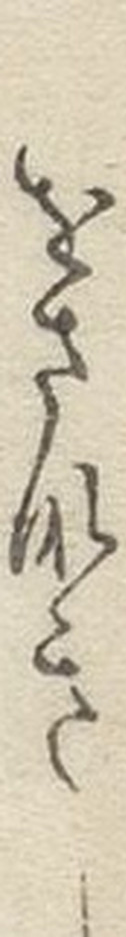をさなき
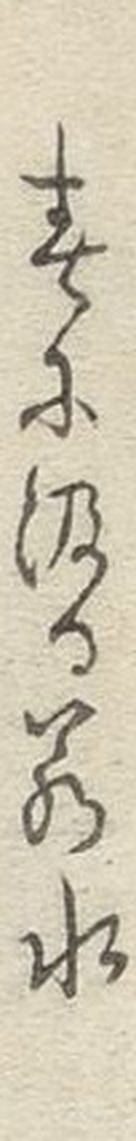春に汲る若水
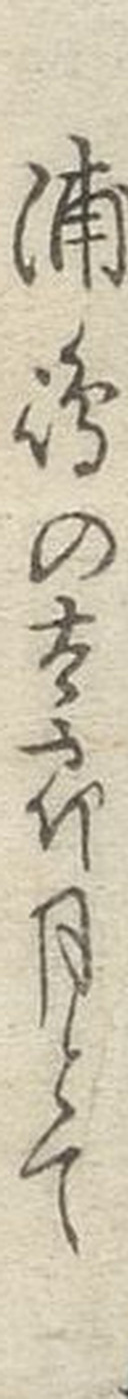浦嶋の太郎月とて
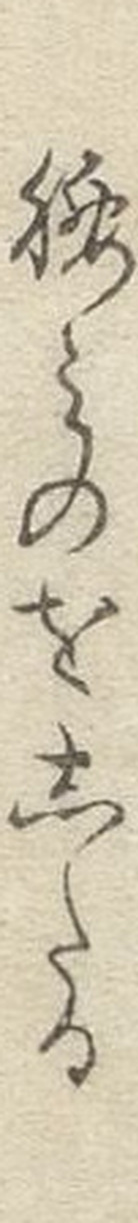腰みのをしたる
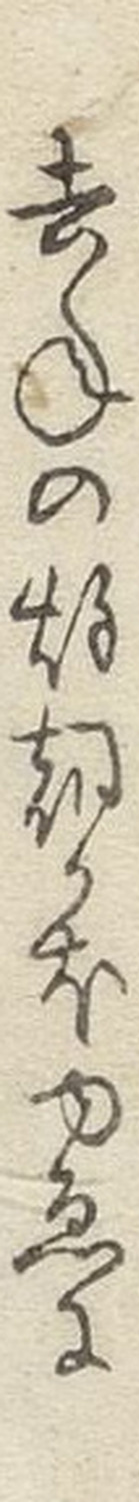去年の秋朝かほゆゑに
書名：Picture Album of People with Kyōka (Light Verse) (Kyōka shiki jinbutsu 狂歌四季人物)
